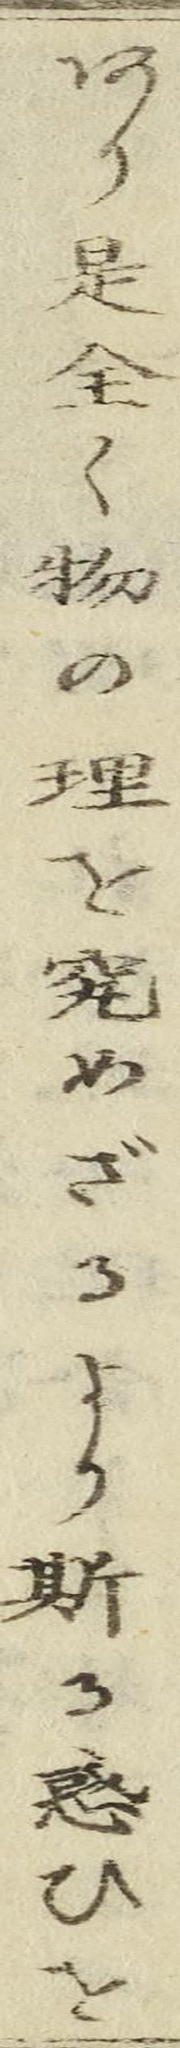あり是全く物の理を究めざるより斯る惑ひを
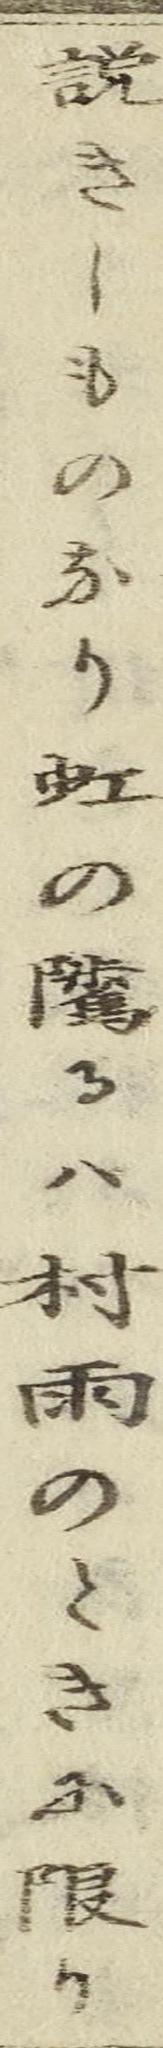説きしものなり虹の騭るは村雨のときに限り
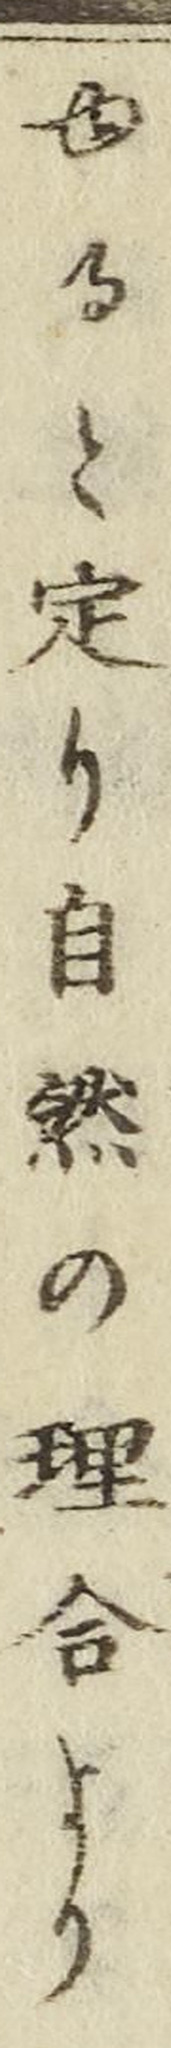ゆると定り自然の理合より
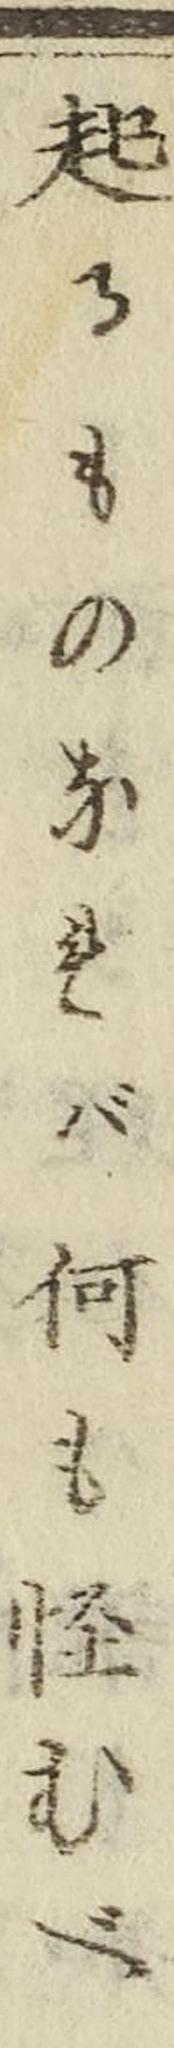起るものなれば何も怪むべ
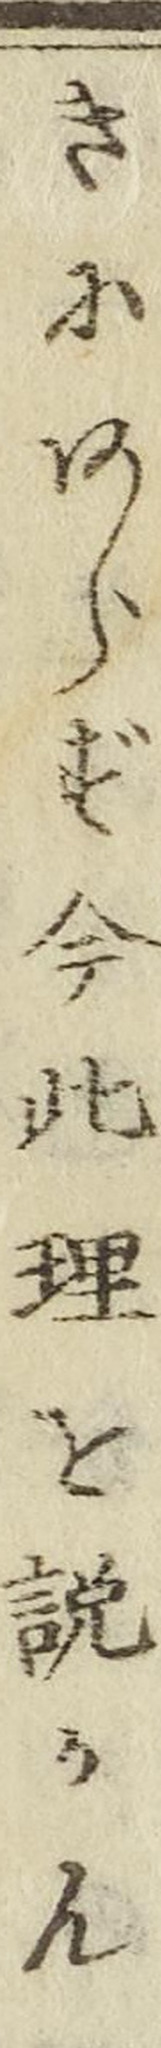きにあらず今此理を説かん
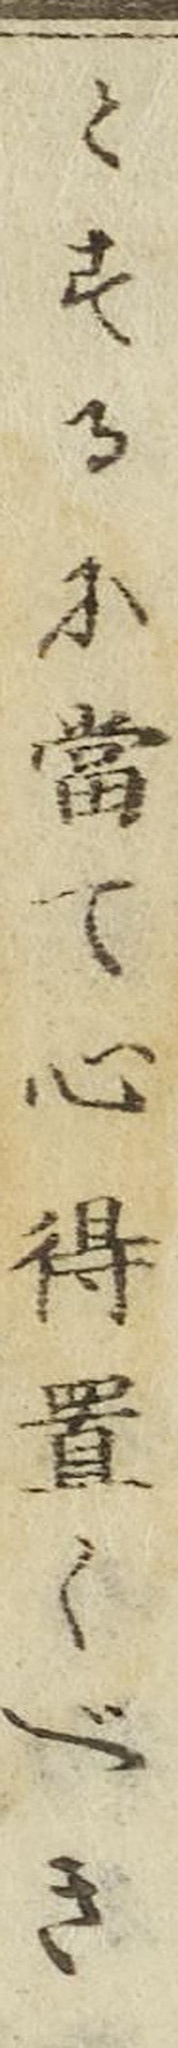とするに当て心得置くべき

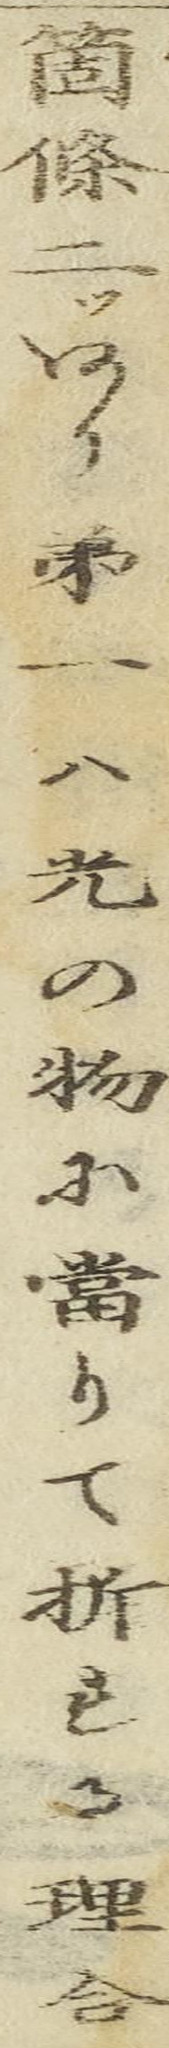箇條二ツあり第一は光の物に当りて折れる理合
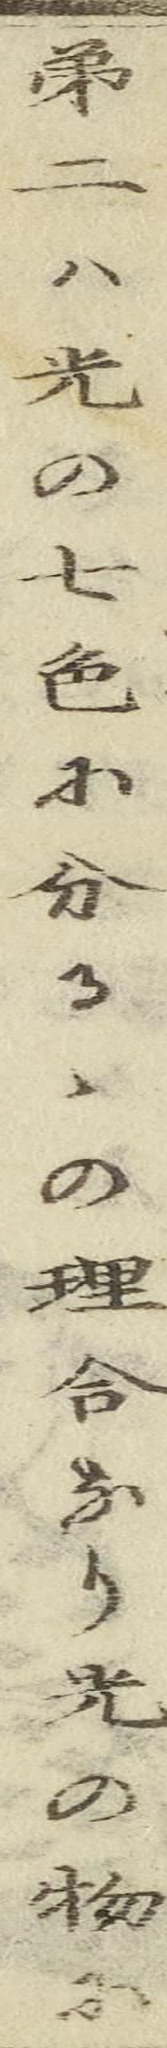第二は光の七色に分るゝの理合なり光の物に
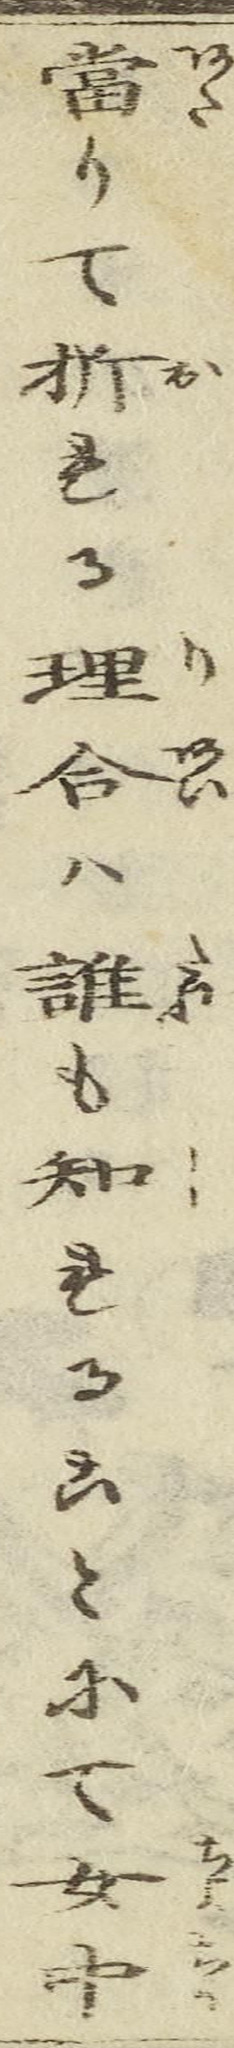当りて折れる理合は誰も知れることにて女中
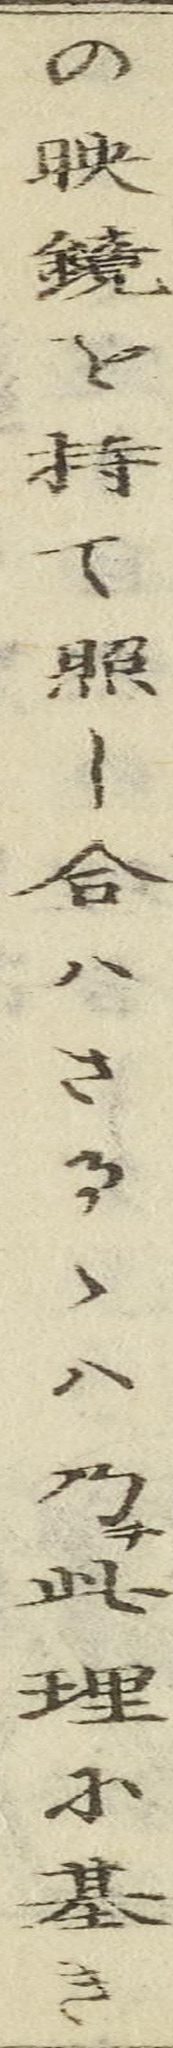の映鏡を持て照し合はさるゝは乃チ此理に基き
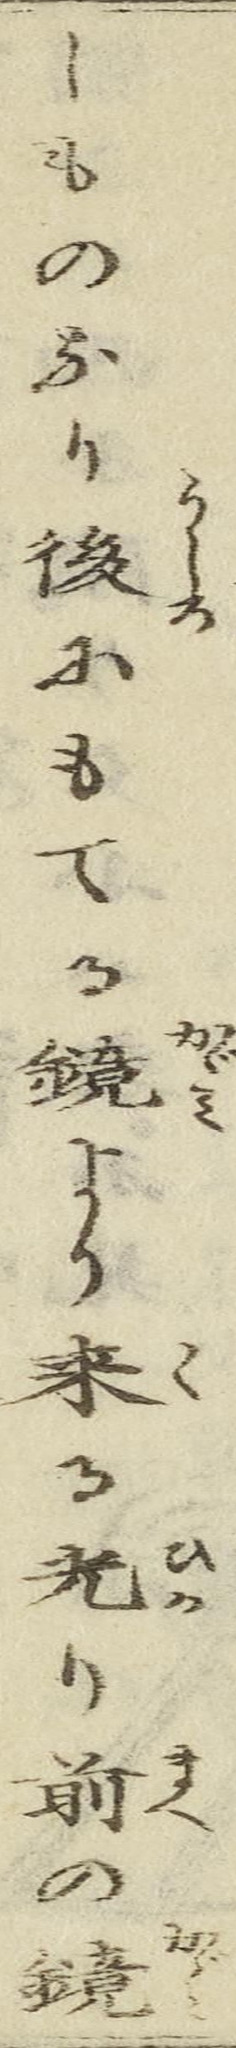しものなり後にもてる鏡より来る光り前の鏡
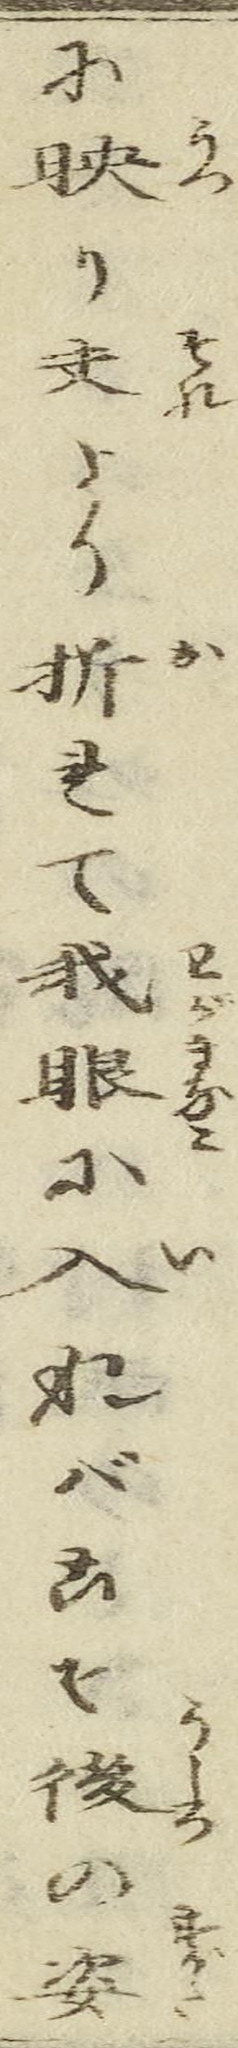に映り夫より折れて我眼に入ればこそ後の姿
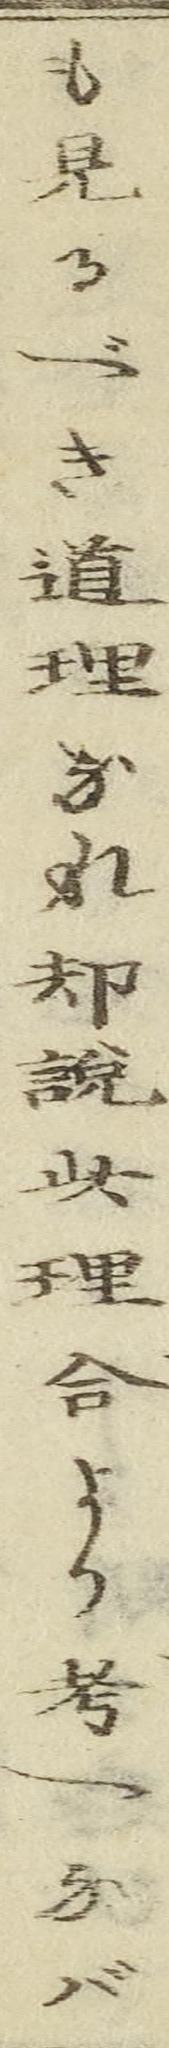も見るべき道理なれ却説此理合より考へなば
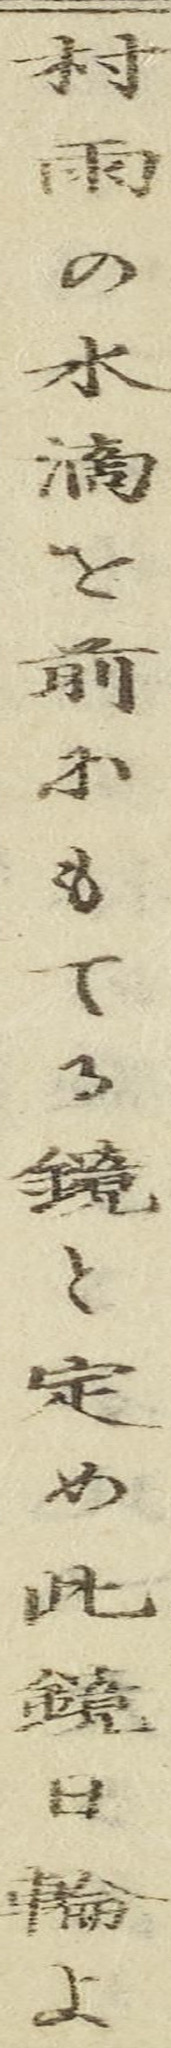村雨の水滴を前にもてる鏡と定め此鏡日輪よ
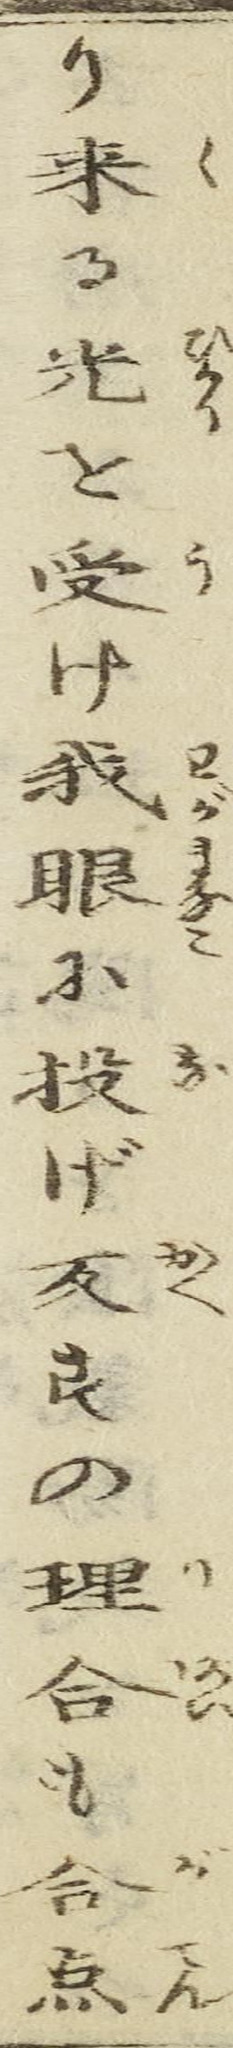り来る光を受け我眼に投げ反すの理合も合点
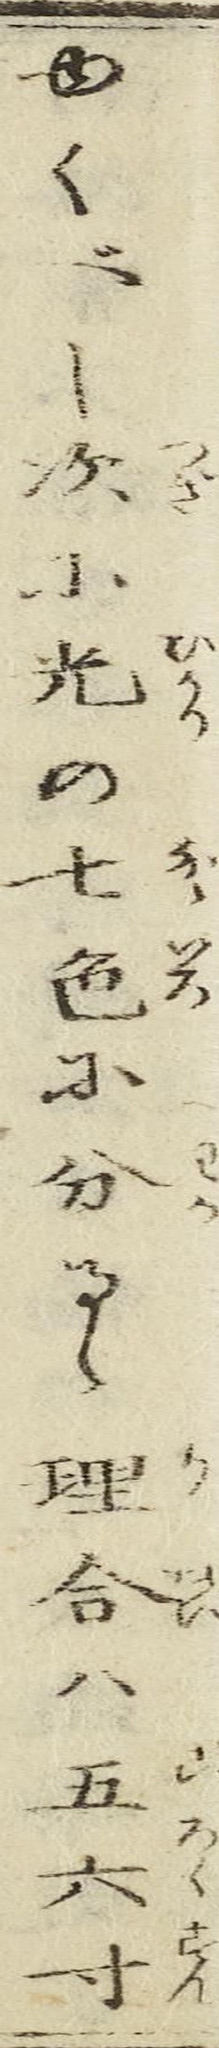ゆくべし次に光の七色に分るゝ理合は五六寸
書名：天変地異
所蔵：東京大学地震研究所図書室 Earthquake Research Institute Library, The University of Tokyo, JAPAN
